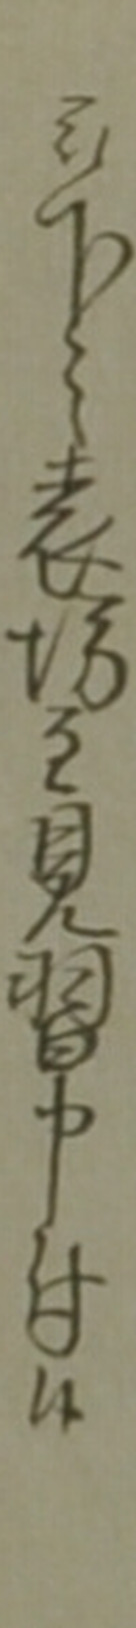被下之表坊主見習申付候
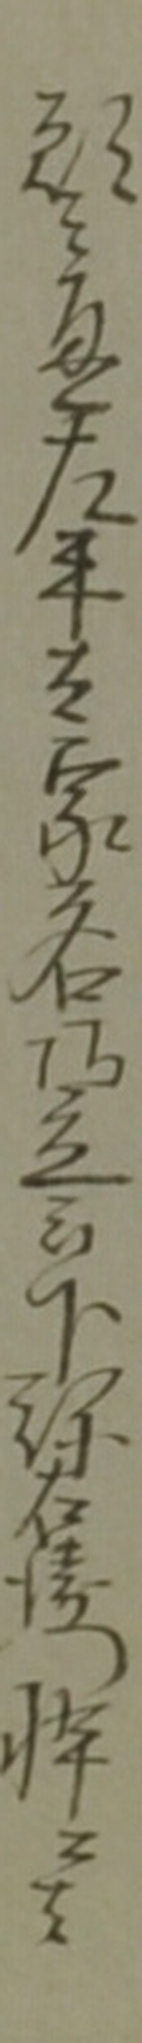願之通左平太家名御立被下弥右衛門忰ニて
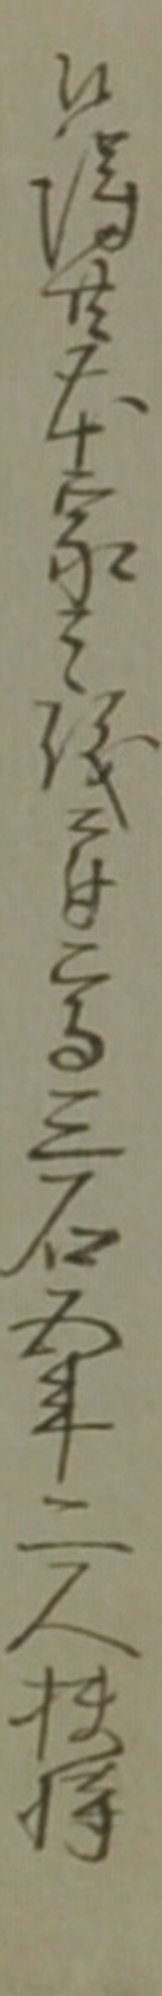候得共本家之儀ニ付高三石五斗二人扶持
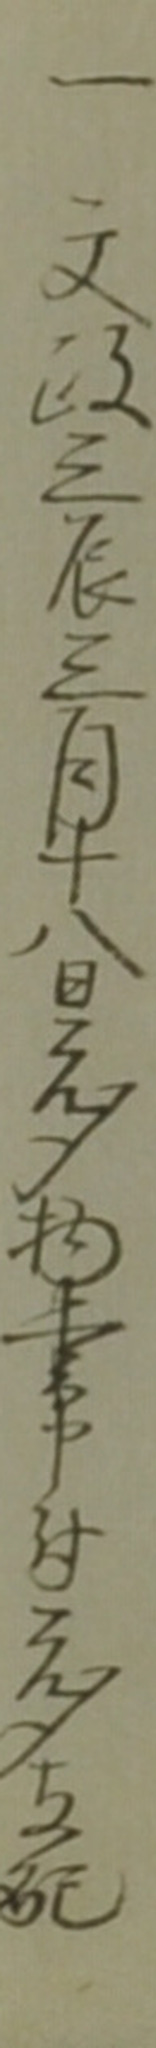一文政三辰三月十八日元〆物書申付元〆支配
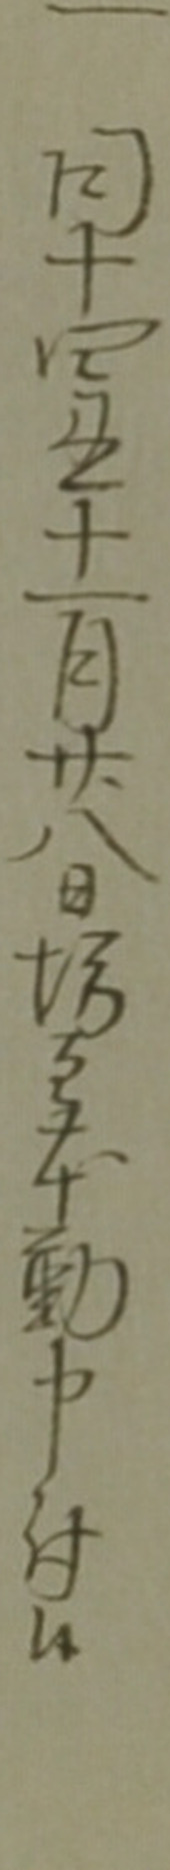一同十四丑十一月廿八日坊主本勤申付候

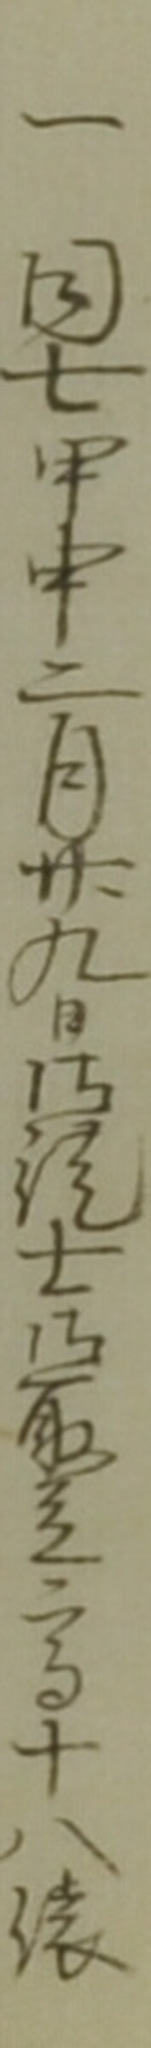一同七甲申二月廿九日御徒士御取立高十八俵
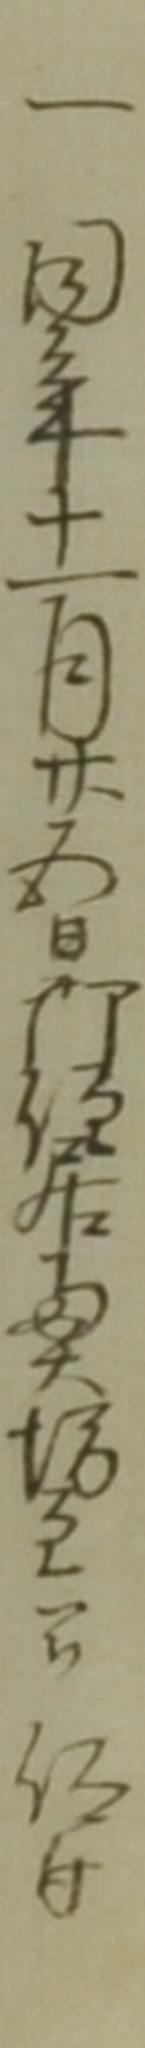一同年十一月廿五日御住居奥詰坊主被仰付
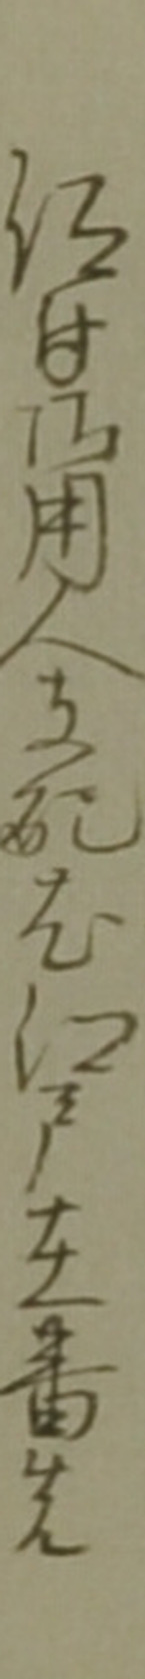仰付御用人支配尤江戸在番先
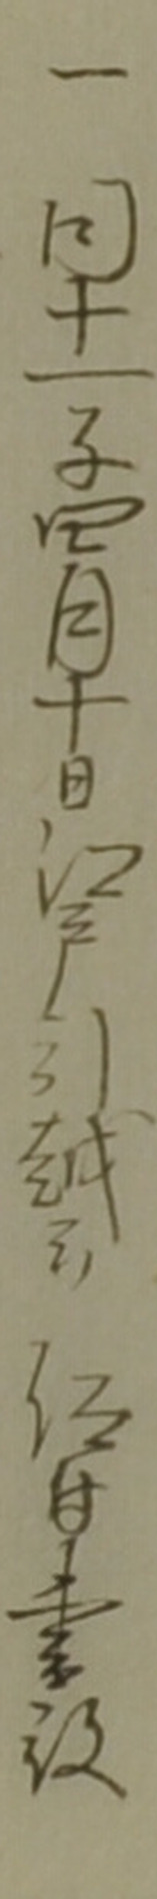一同十一子四月十日江戸引越被仰付書役
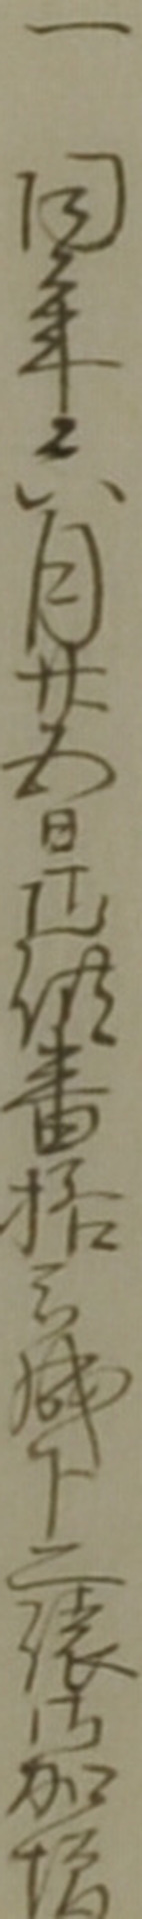一同年六月廿五日御供番格被成下二俵御加増
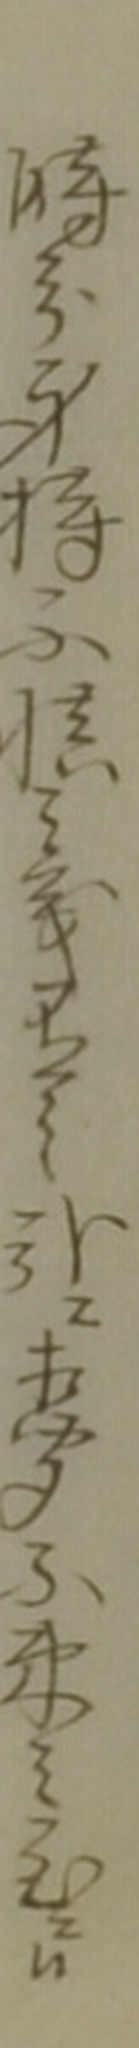時分身持不慎之義有之外ニ相聞不束之至ニ候
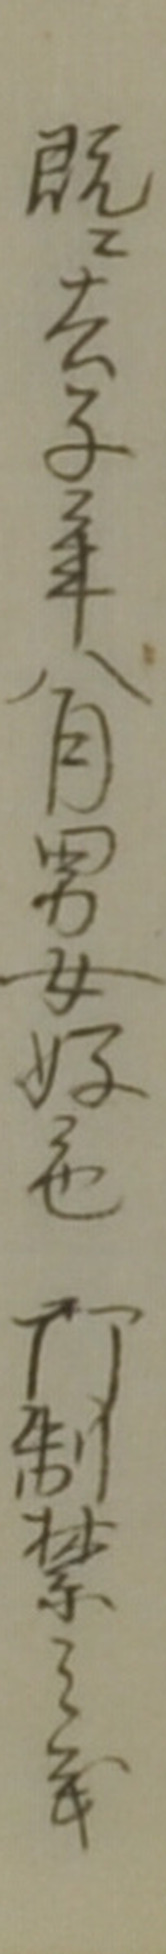既ニ去子年八月男女好々也御制禁之義
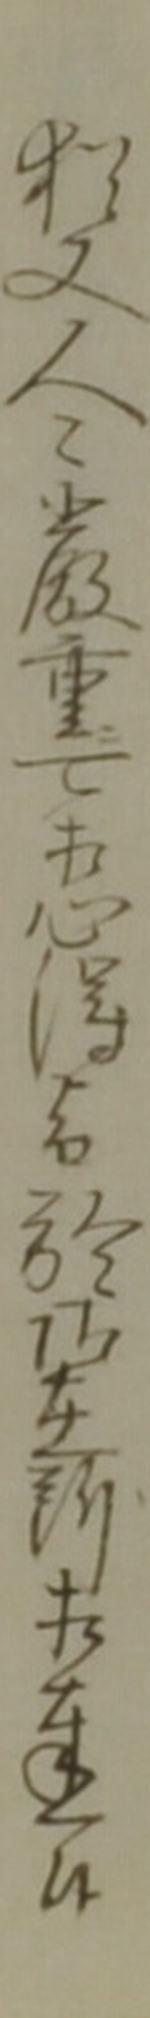猶又人々厳重ニ可相心得与於御在所相達候
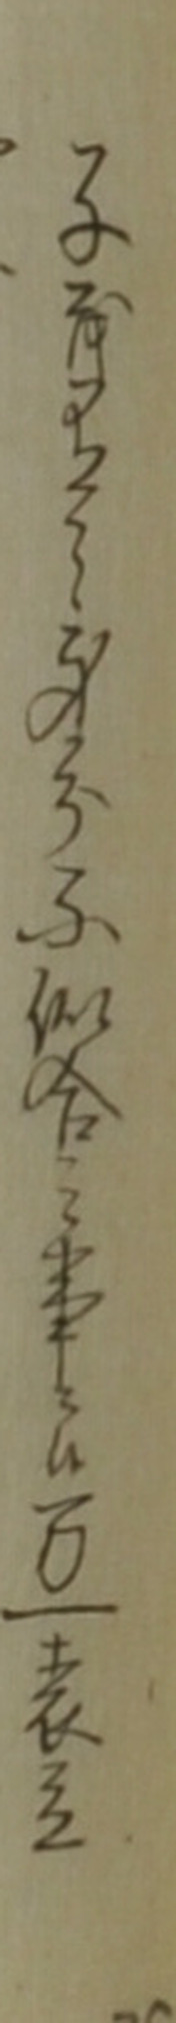子義有之身分不似合之事ニ候万一表立

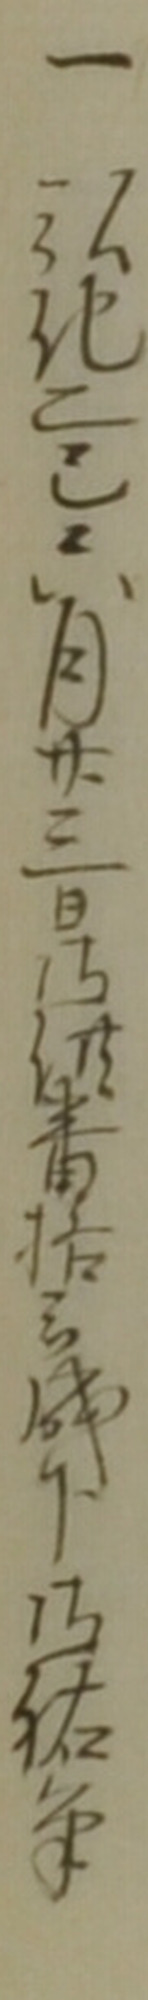一弘化二巳六月廿三日御供番格被成下御祐筆
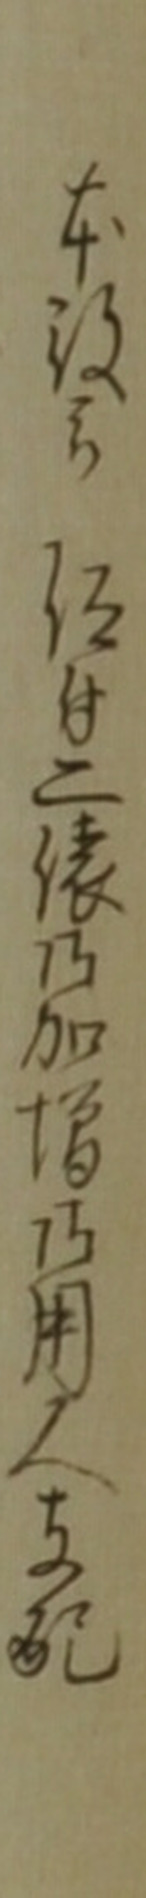本役被仰付二俵御加増御用人支配
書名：無足諸士勤仕録（六）
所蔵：伊那市立高遠町図書館・合同会社AMANE
